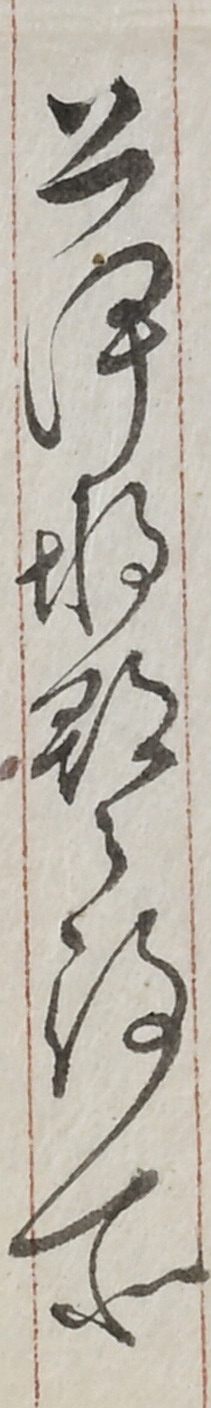上伊那郡々役所
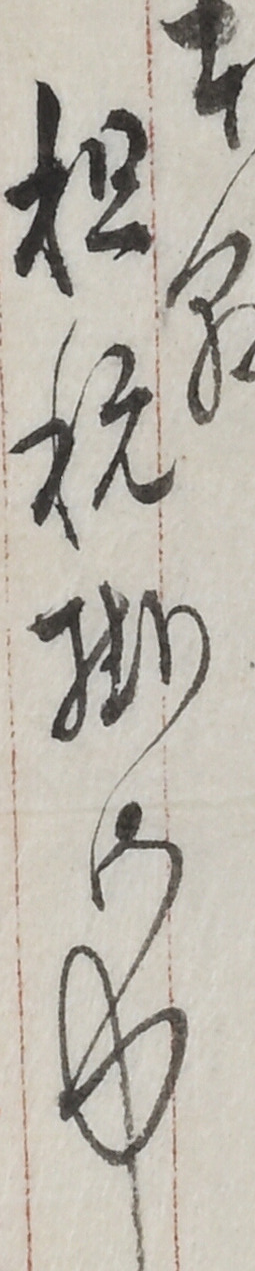祖祝掛御中

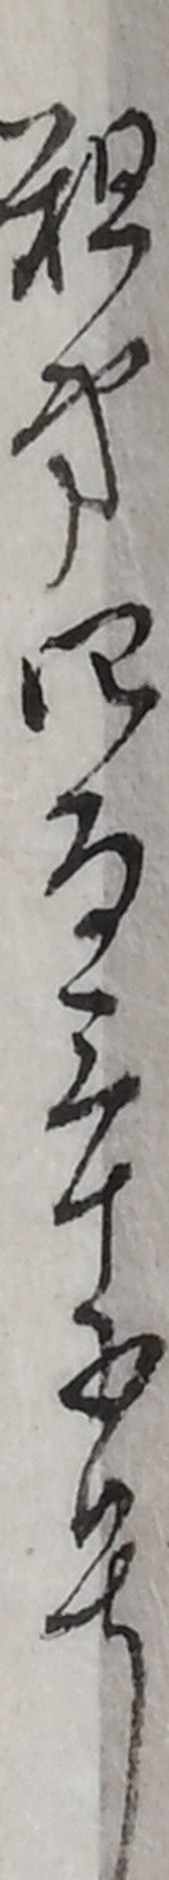租第四百三十五号
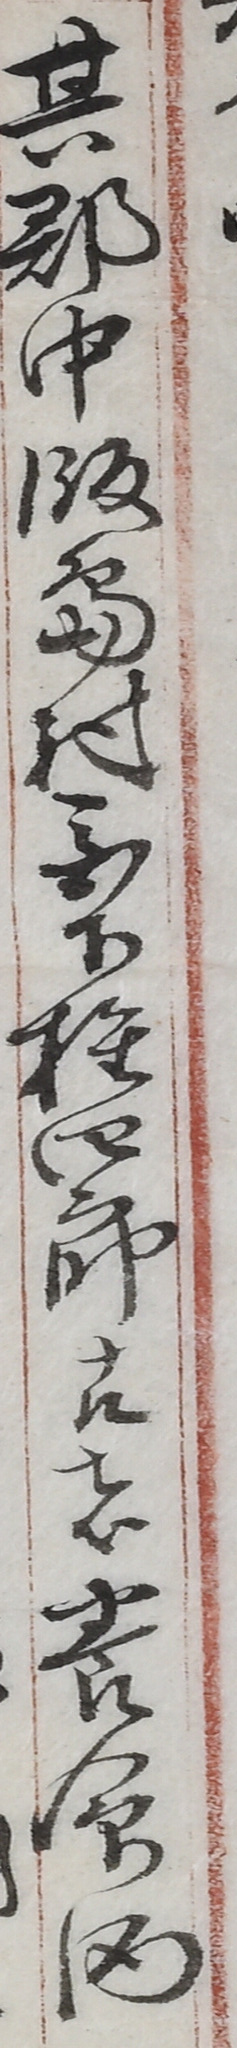其郡中飯島村宮下権四郎古者養命酒
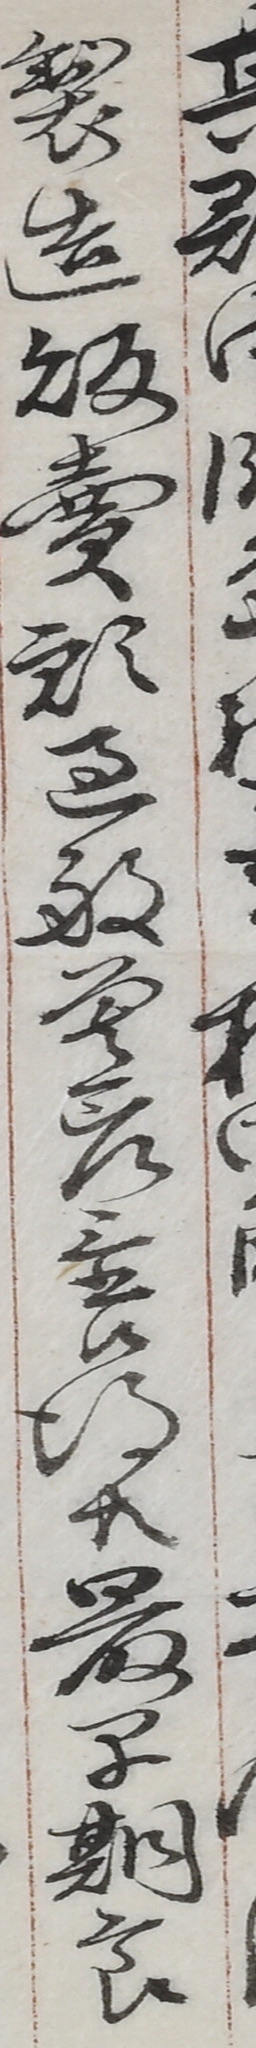製造販売頼過般筆差置候得共最早期節
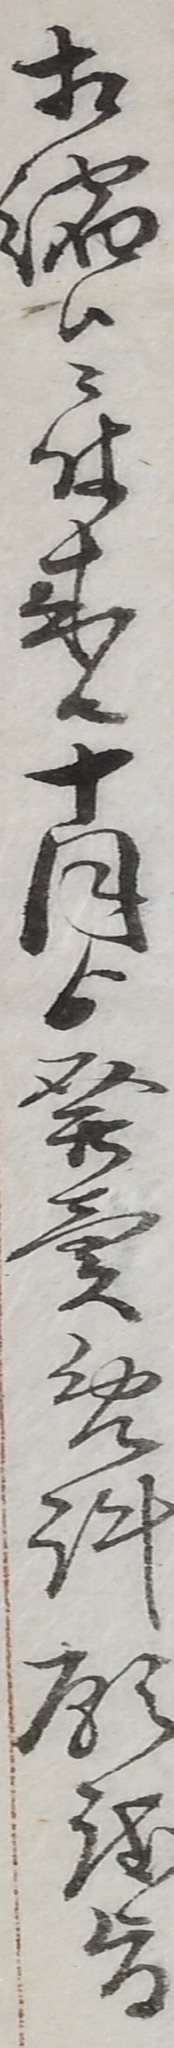相縮候ニ付来ル十月ゟ発売免許願議旨
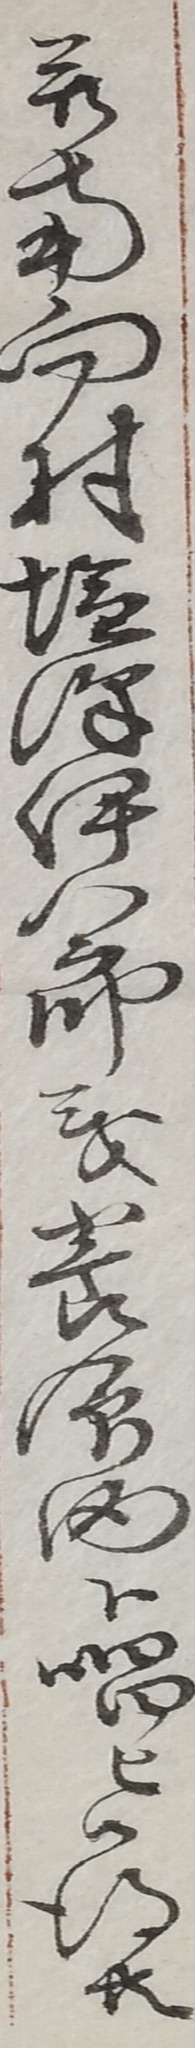并南向村塩澤伊八郎義養命酒ト唱ヒ候得共
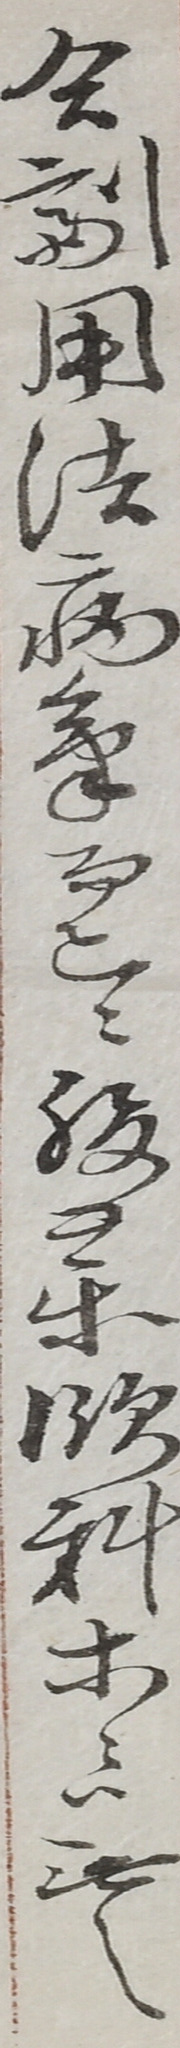快副用法病気而已ニ服薬飲料等ニハ無之
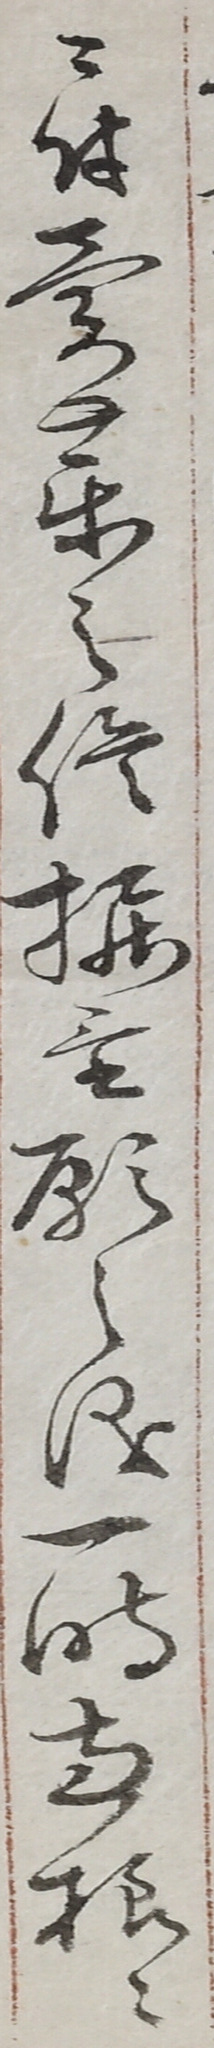ニ付売薬之停据置願之儀一時両様ニ
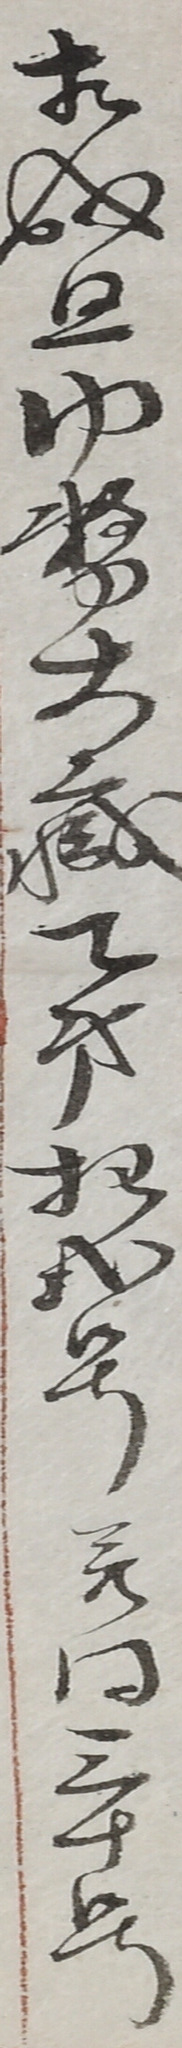相成且内務大蔵七第拾弐号并同三十号
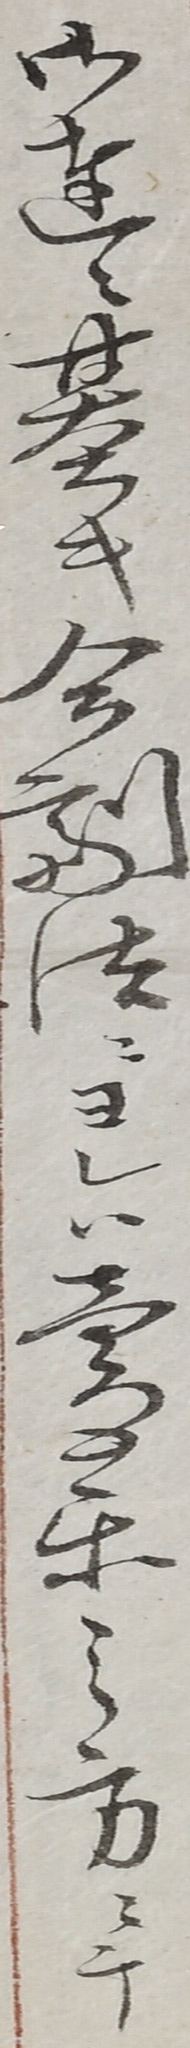御達ニ基キ合劇法ニキレハ売薬之方ニテ
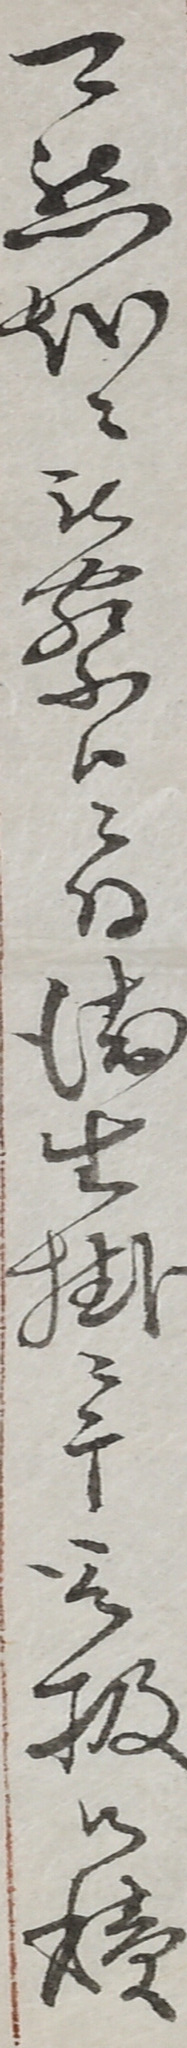可然哉ニ被察候ニ付補生掛ニテ取扱候積
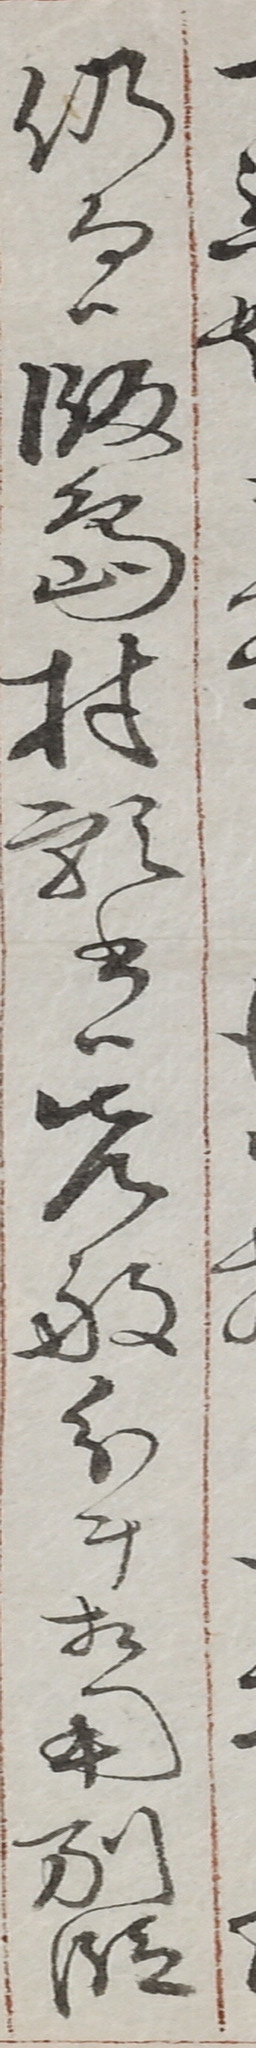仍而ハ飯島村願書ハ先般分ヲ相用別段
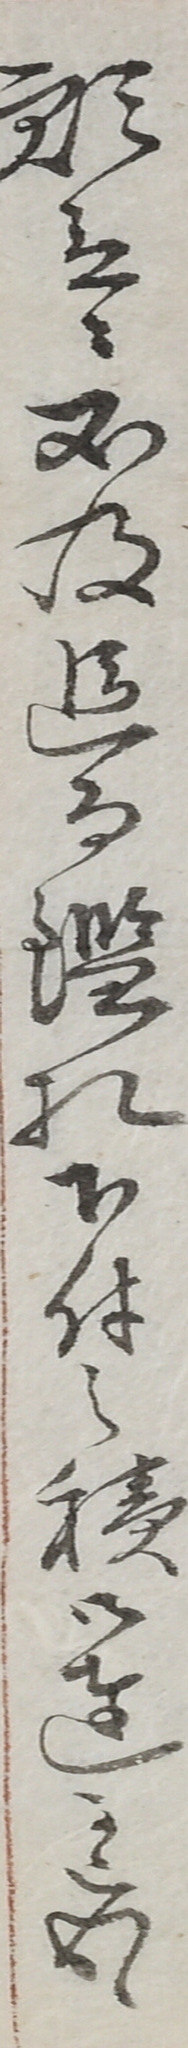願立ニ不及追而鑑札下付之積御達被成候
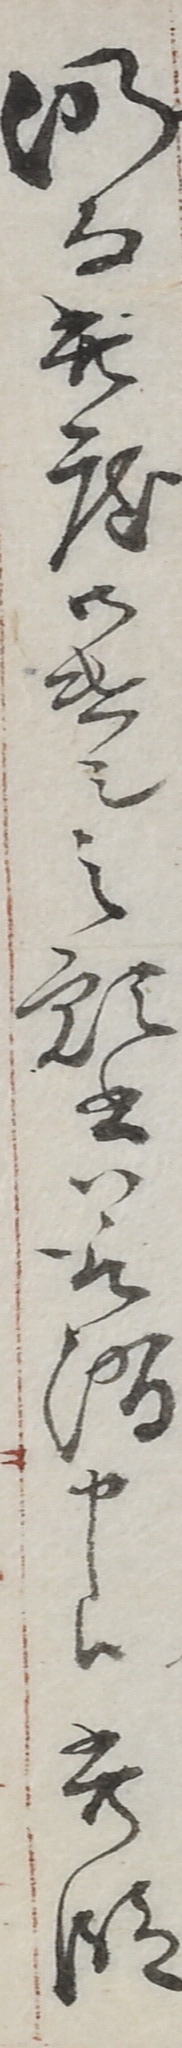仍而此度御遣シ之願書は取消申候此段

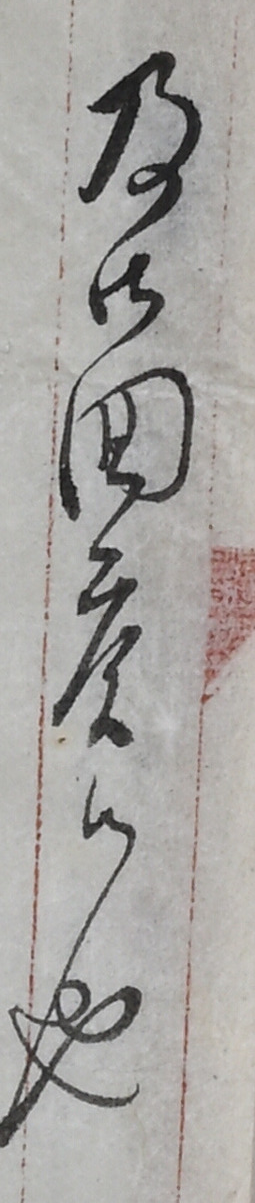及御田渡候也
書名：郡役所勤務中御用抜書
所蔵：伊那市立高遠町図書館・合同会社AMANE
